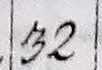32
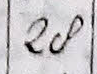28
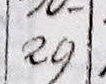29
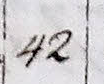42
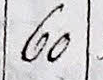60
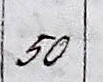50
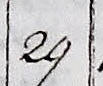29
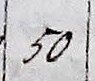50
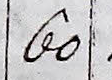60
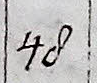48
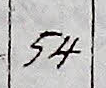54
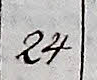24
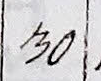30
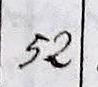52
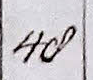48
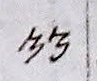33
